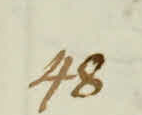48
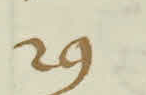29
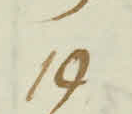19
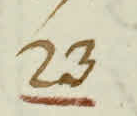23
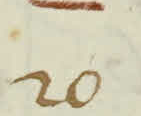20
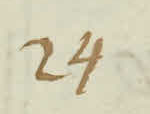24
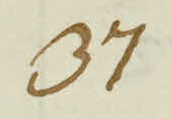37
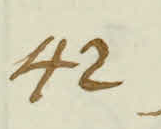42
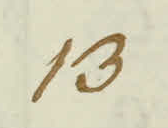13
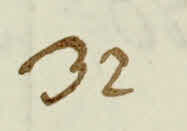32
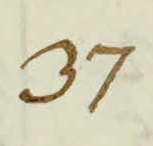37
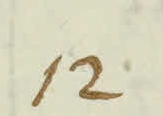12
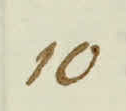10
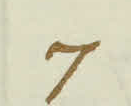7
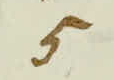5
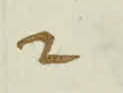2
